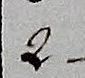2
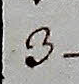3
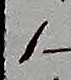1
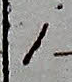1
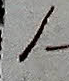1
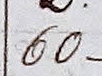60
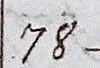78
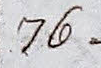76
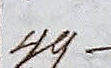49
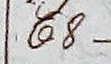68
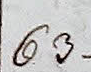63
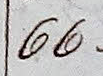66
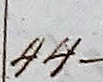44
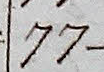77
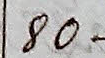80
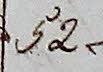52
